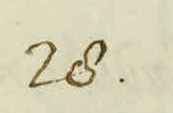28.
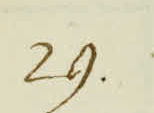29.
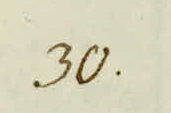30.
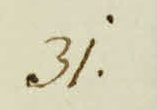31.
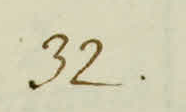32.
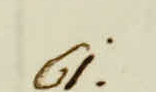61.
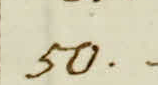50.
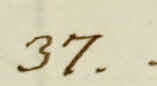37.
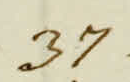37
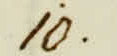10.
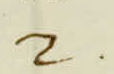2
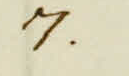7.
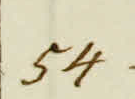54
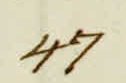47
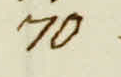70
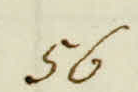56
